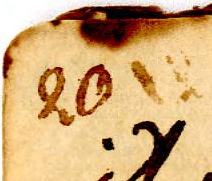20
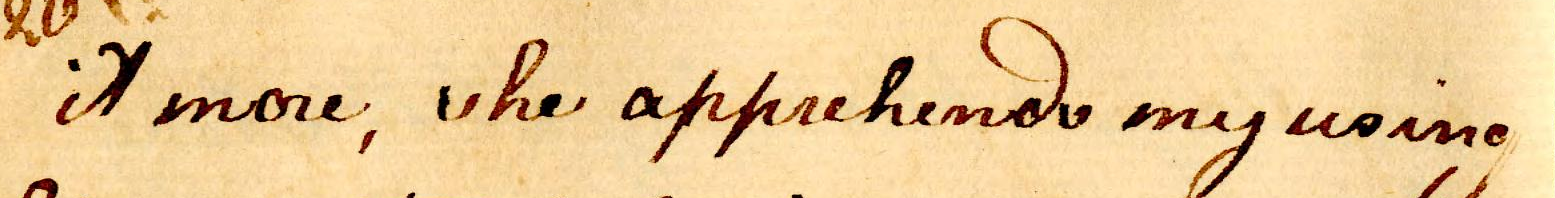it more, she apprehends my using
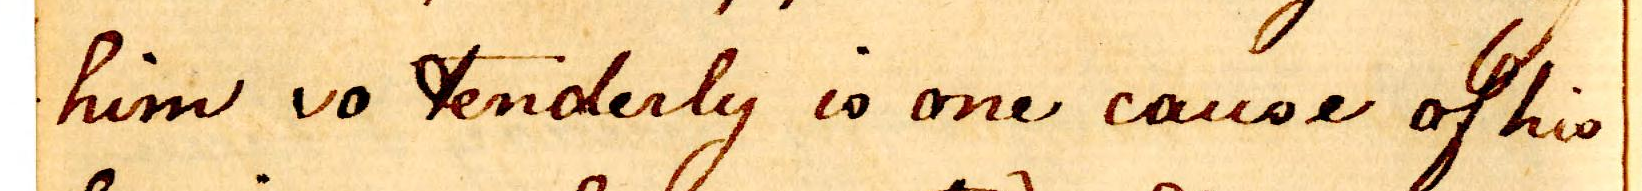him so tenderly is one cause of his
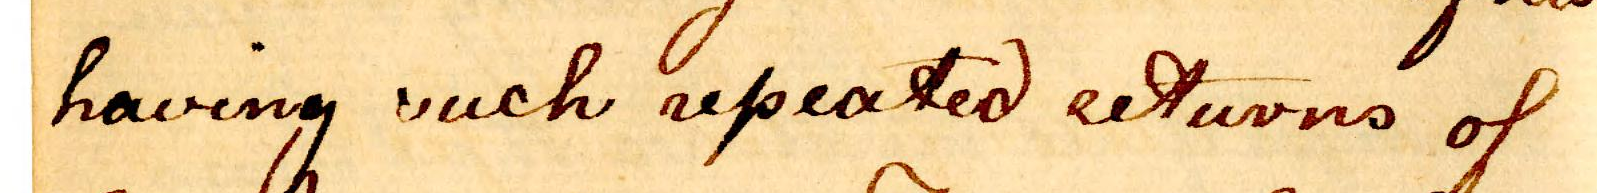having such repeated returns of
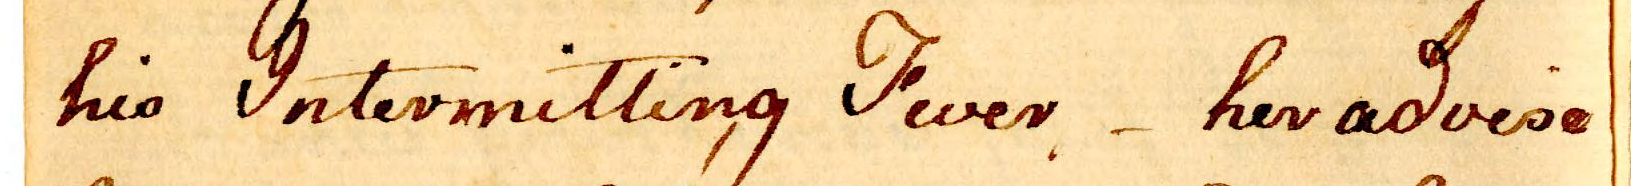his Intermitting Fever- her advise
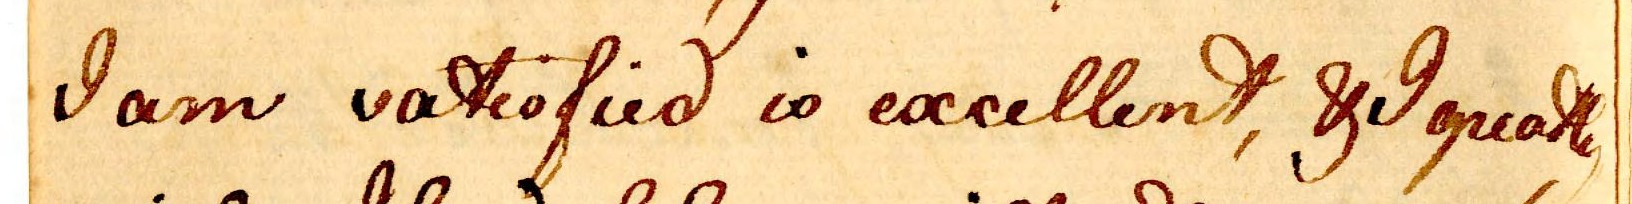I am satisfied is excellent, & I greatly
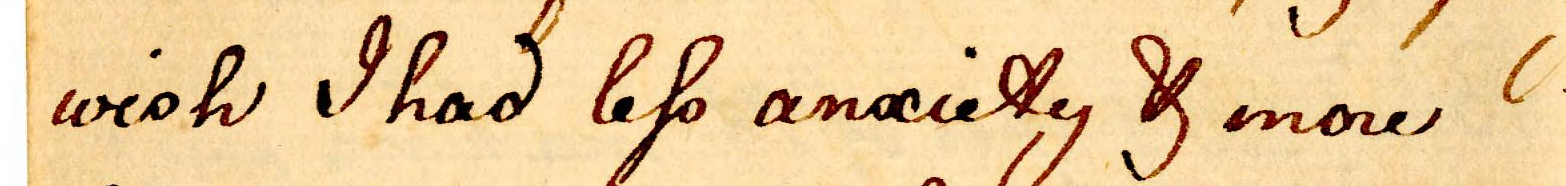wish I had less anxiety & more
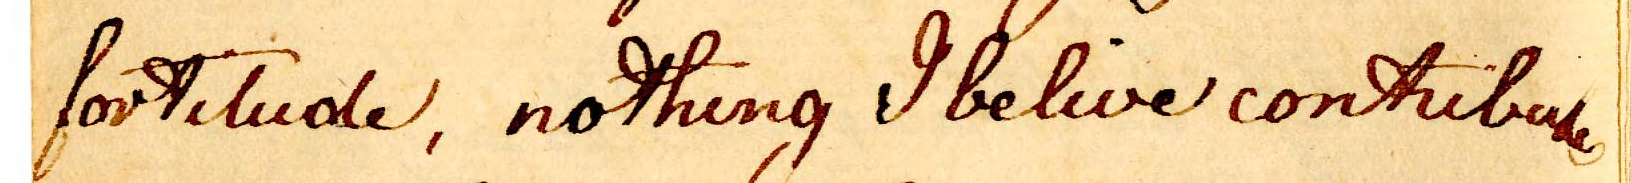fortitude, nothing I belive contribute
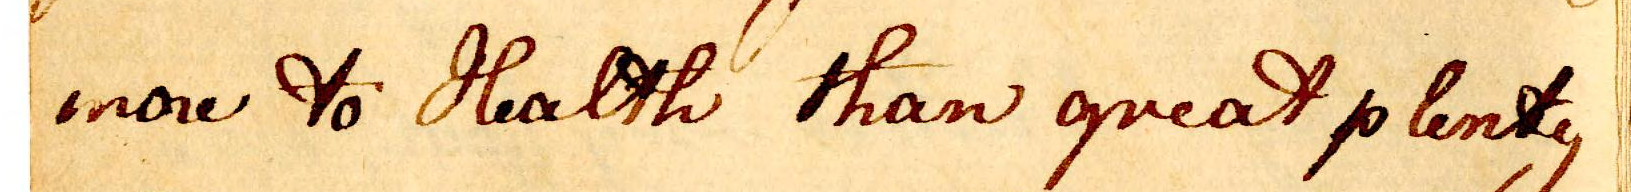more to Health than great plenty
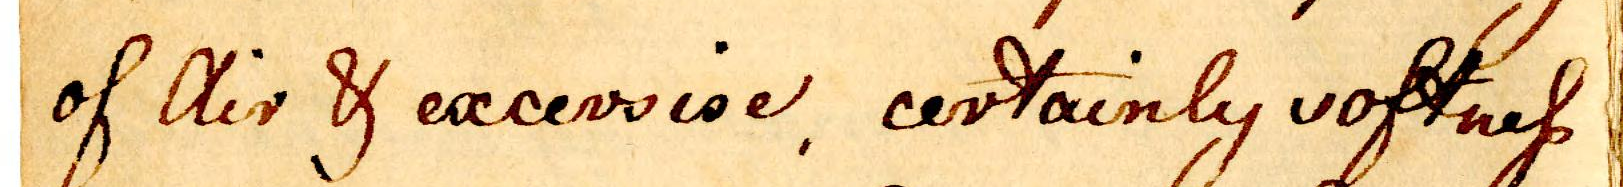of Air & excersise, certainly softness
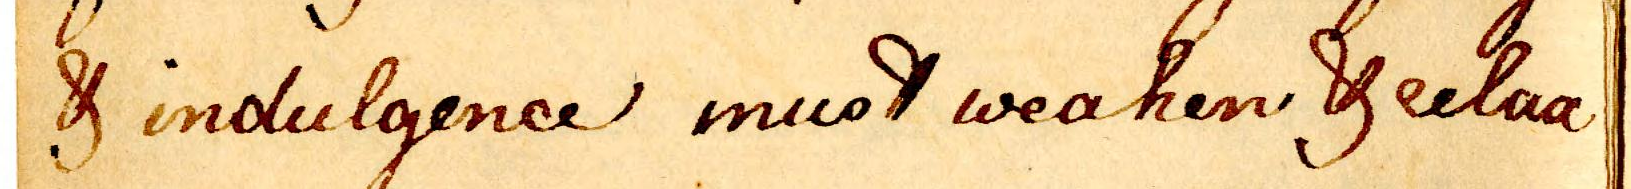& indulgence must weaken & relax
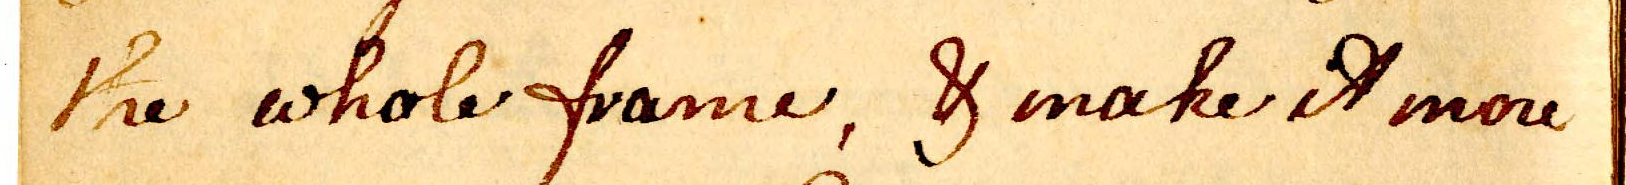the whole frame, & make it more
